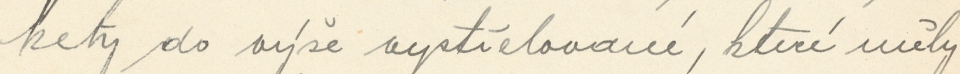kety do výše vystřelované, které měly
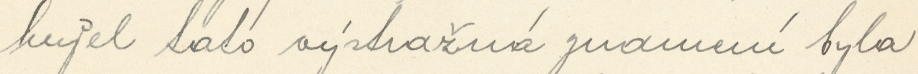hužel tato výstražná znamení byla
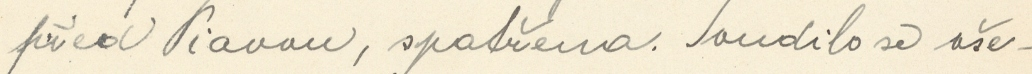před Piavou, spatřena. Soudilo se vše-
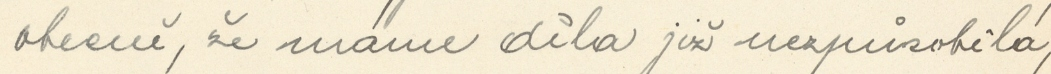obecně, že máme děla již nezpůsobilá,
